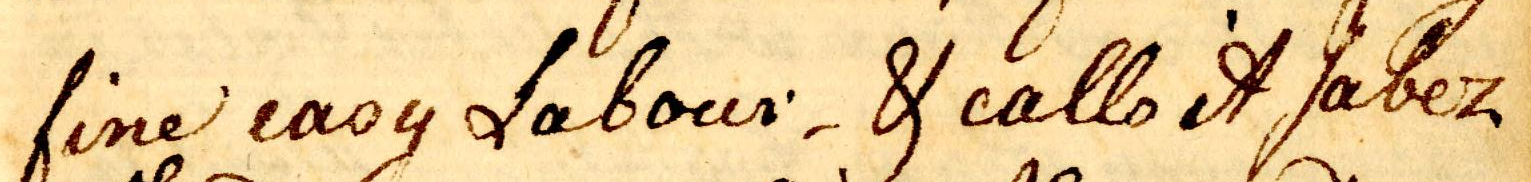fine easy Labour- & calls it Jabez
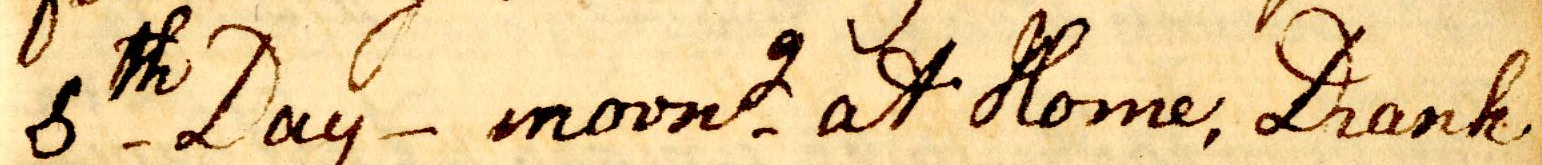5^th Day- morn^g at Home, Drank
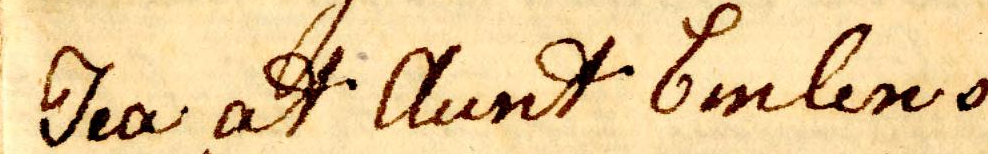Tea at Aunt Emlens
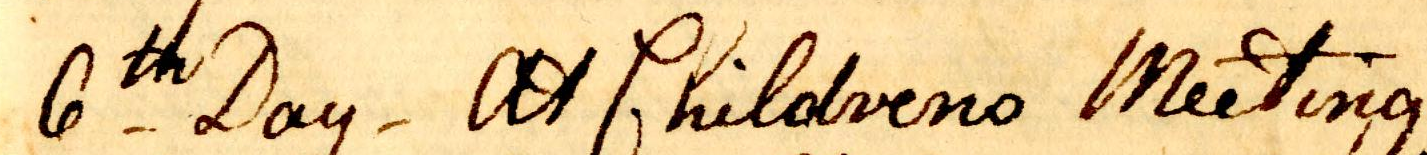6^th Day- At Childrens Meeting
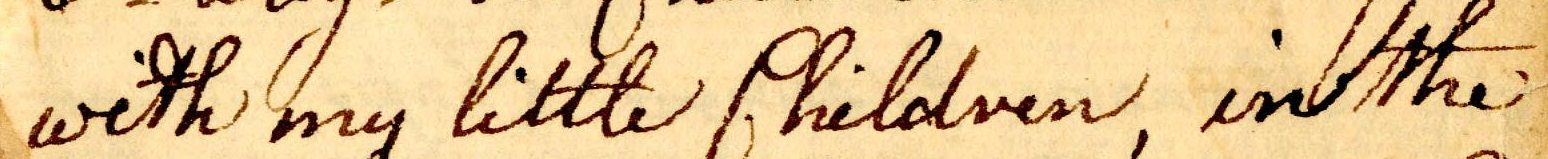with my little Children, in the
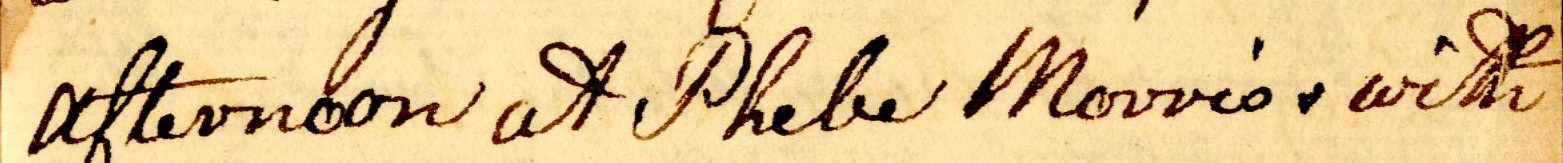afternoon at Phebe Morris. with
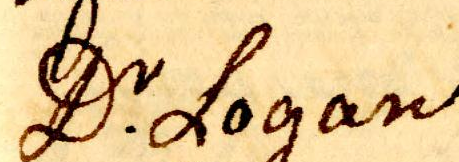D^r. Logan
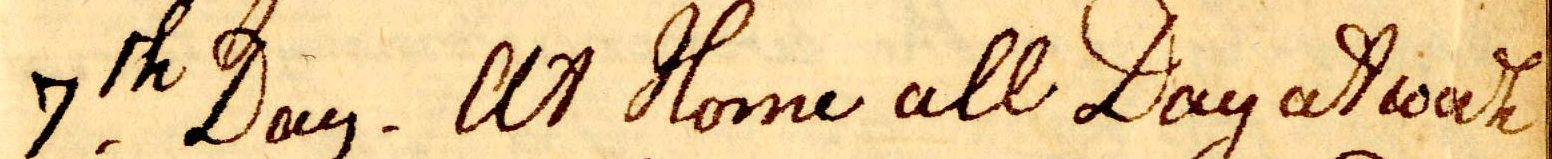7^th Day. At Home all Day at work
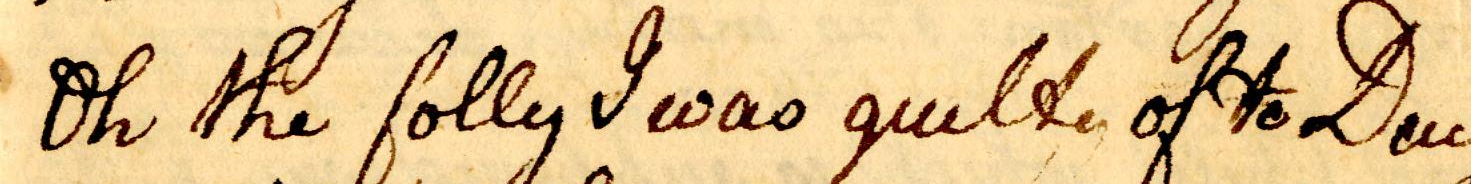Oh the folly I was guilty of to Day
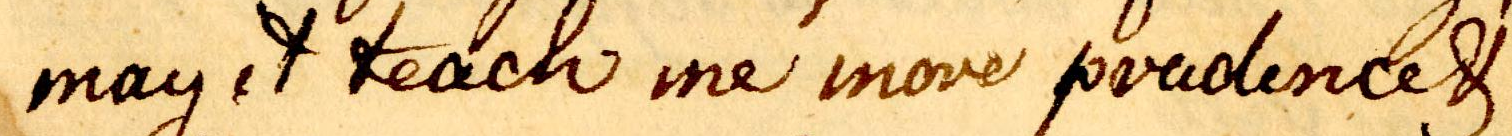may it teach me more prudence &
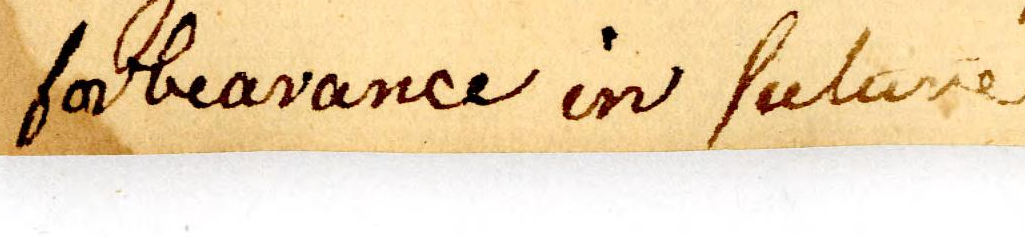forbearance in future
